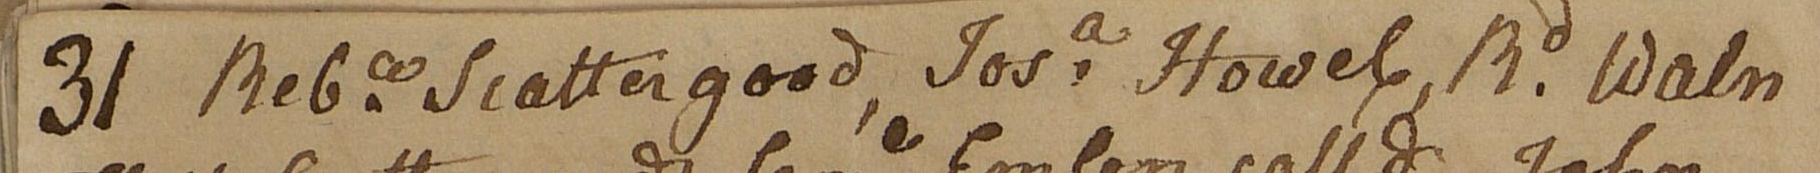31 Reb^a. Scattergood, Jos^a. Howel, R^d. Waln
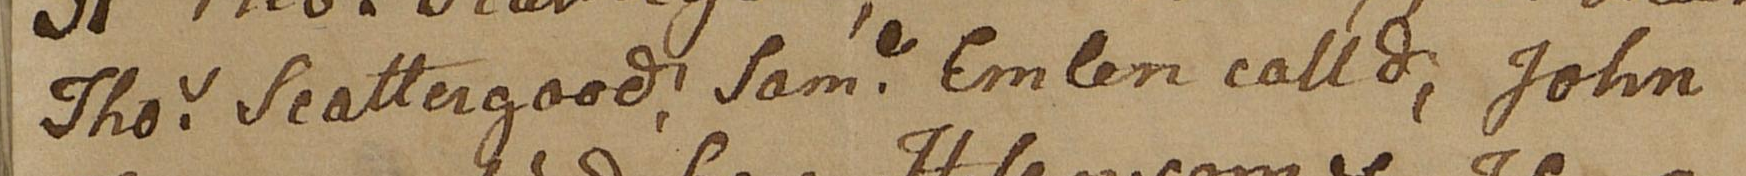Tho^s. Scattergood, Sam^l. Emlen call'd, John
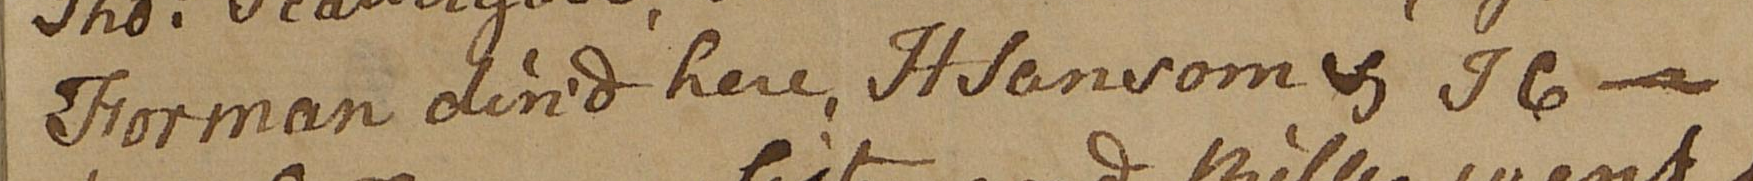Forman din'd here, H Sansom & JC-
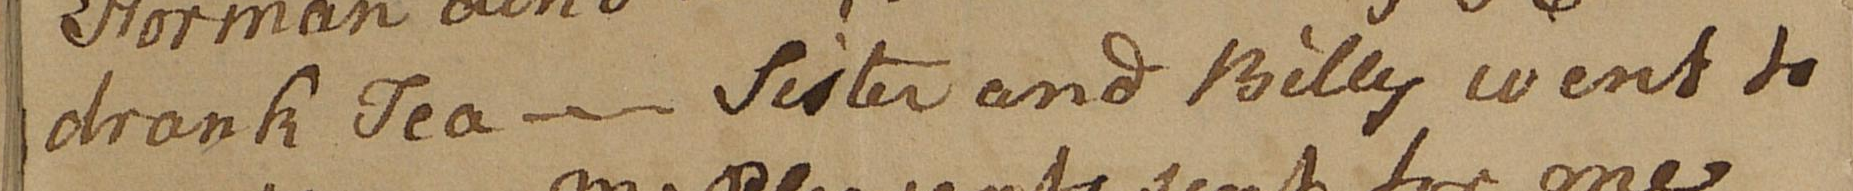drank Tea- Sister and Billy went to
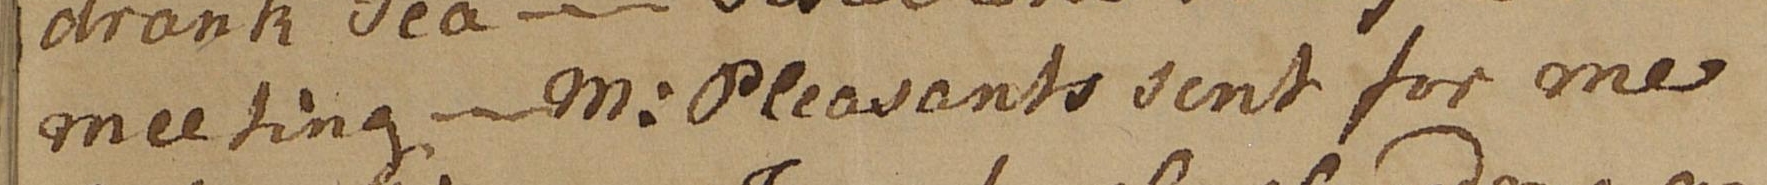meeting- M: Pleasants sent for me
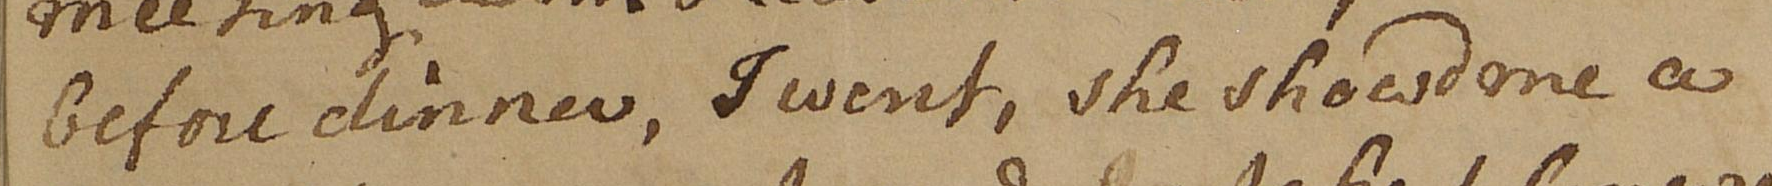before dinner, I went, she showd me a
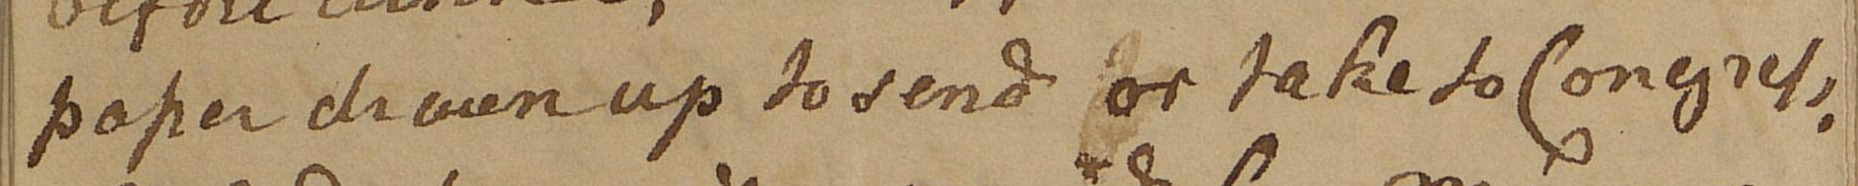paper drawn up to send or take to Congress,
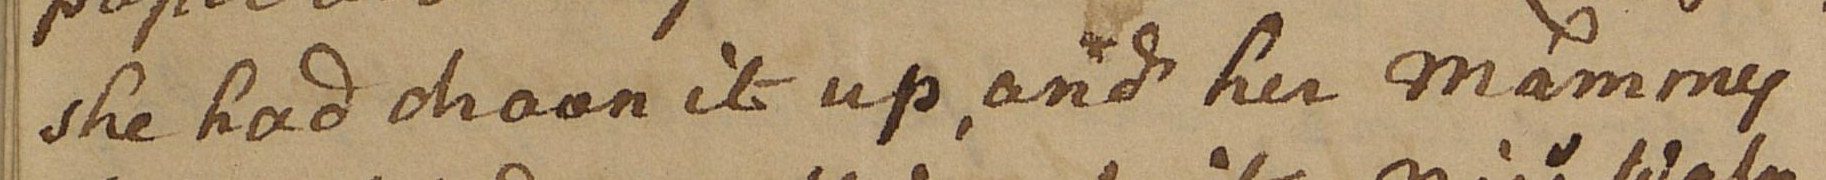she had draun up, and her mammy
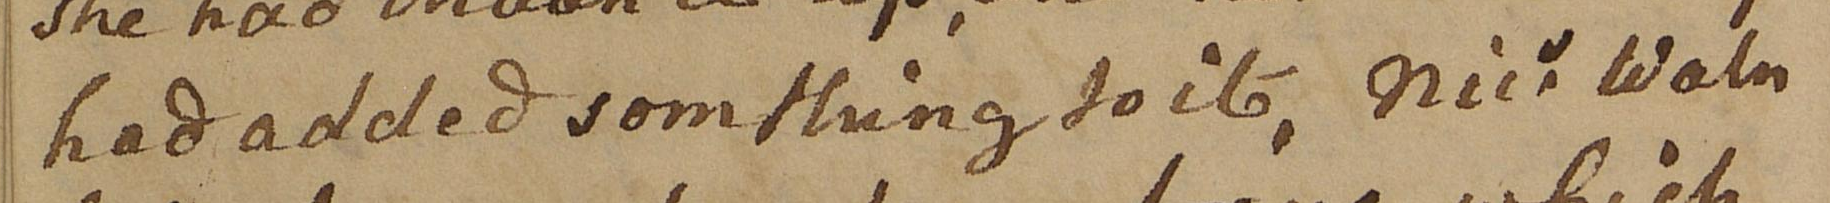had added somthing to it, Nic^s. Waln
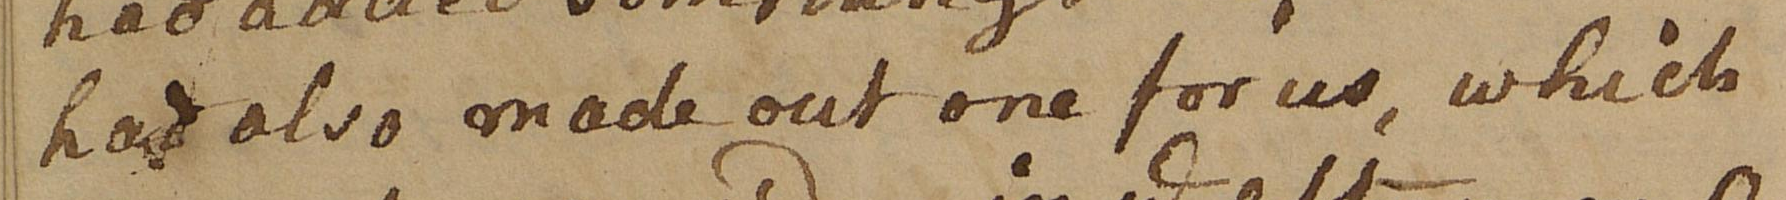had also made out one for us, which
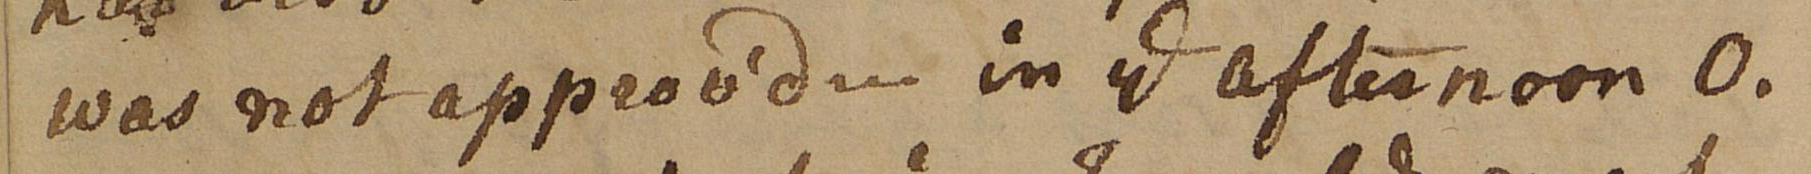was not approv'd- in y^e afternoon O.
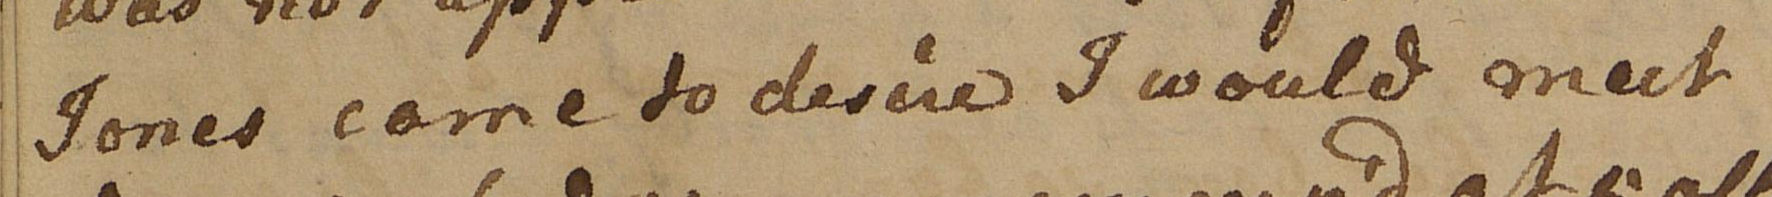Jones came to desire I would meet
